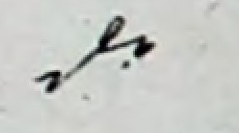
do
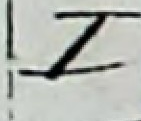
I
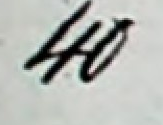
40
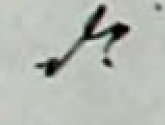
do
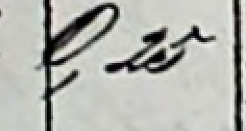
0,25
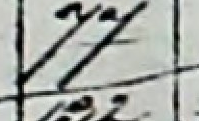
77
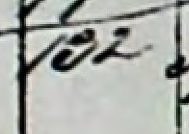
132
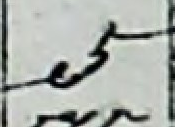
5
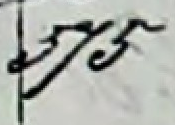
575
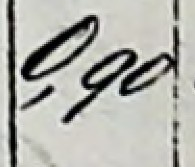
0,90
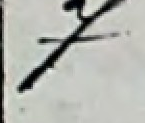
7
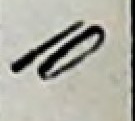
10
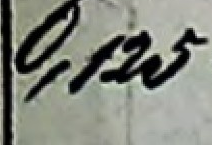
0,125
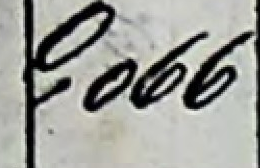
0,066
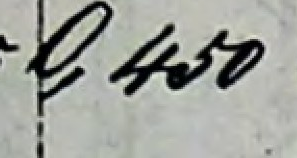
0,450
